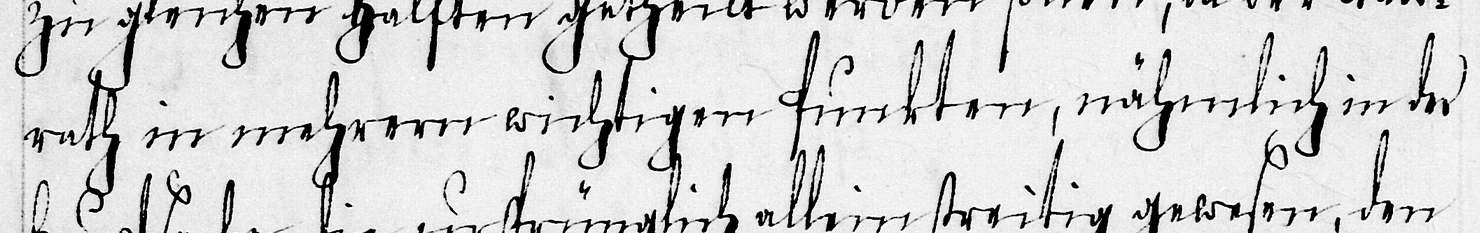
trath in mehrern wichtigen Punkten, nämlich in der
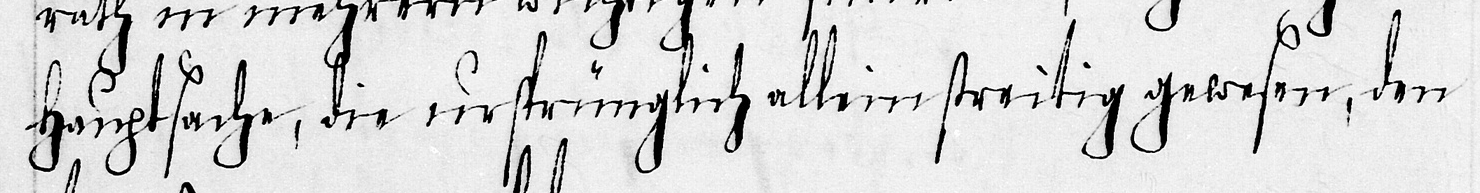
Hauptsache, die ursprünglich allein streitig gewesen, den
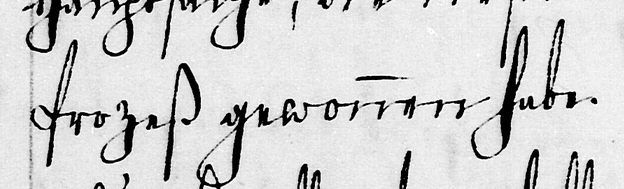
Prozeß gewonnen habe.
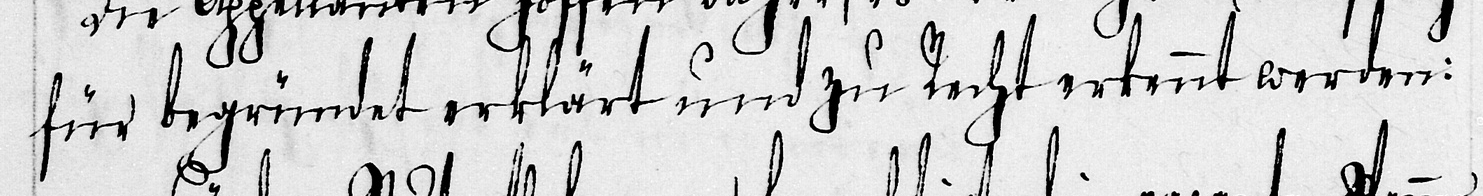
für begründet erklärt und zu Recht erkennt werden:
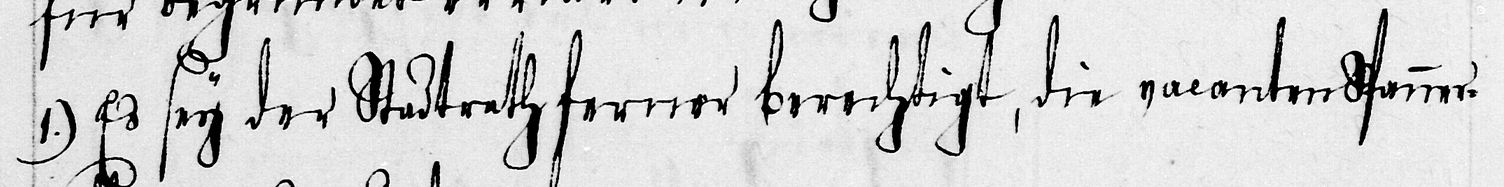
1.) Es sey des Stadtrath ferner berechtigt, die vacanten Spanne¬
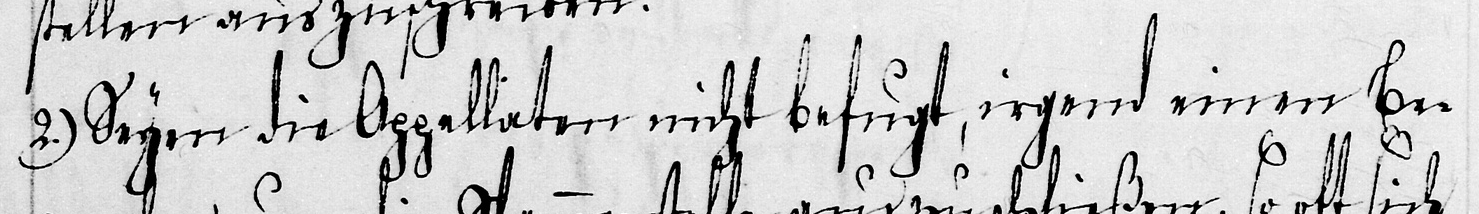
2.) Seyen die Appellaten nicht befugt, irgend einen Be¬
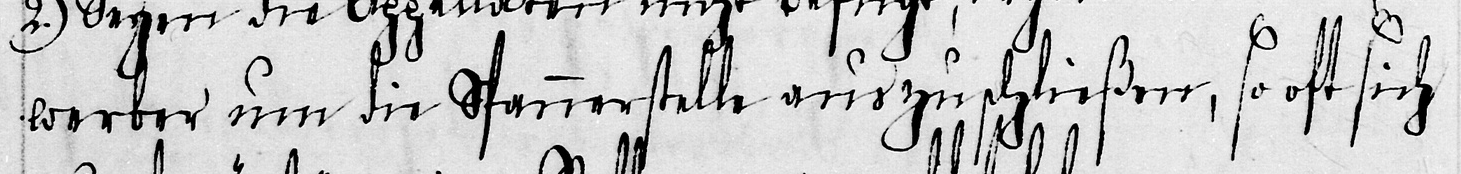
werber um die Spannerstelle auszuschließen, so oft sich
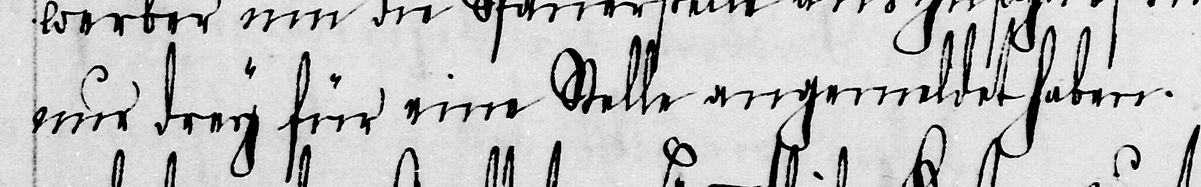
nur drey für eine Stelle angemeldet haben.
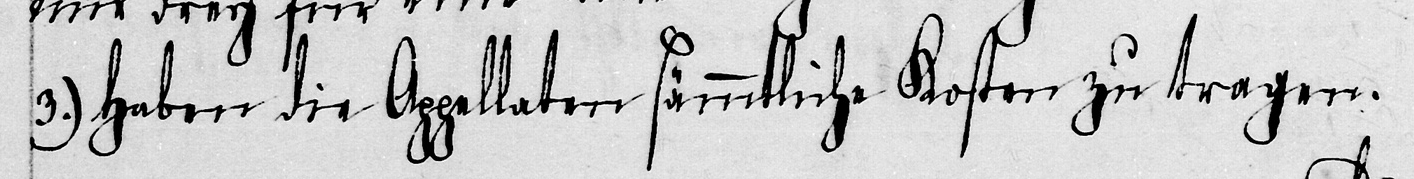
3.) Haben die Appellaten sämmtliche Kosten zu tragen.
